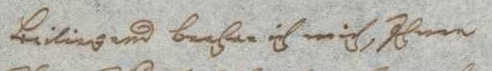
Beiliegend beehre ich mich, Ihnen
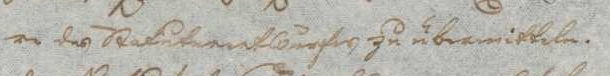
re des Statutenentwurfes zu übermitteln.
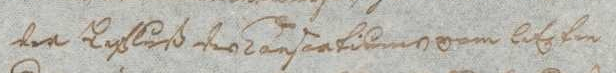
Der Beschluß des Consortiums vom letzten
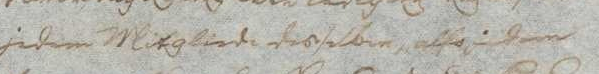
jedem Mitgliede desselben, also jedem
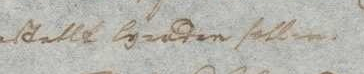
gestellt werden sollen.
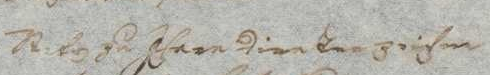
Stets zu Ihren Diensten zeichne
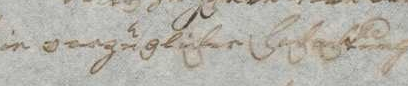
in vorzüglicher Hochachtung
